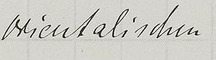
orientalischen
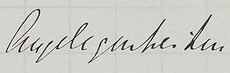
Angelegenheiten
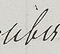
lassen
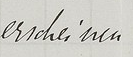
erscheinen.
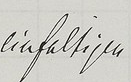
einfältigen
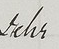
richte
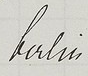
Berlin
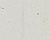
scheint
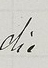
die
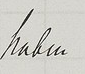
samkeit
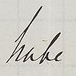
habe
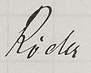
heute
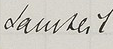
verständigt,
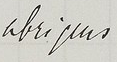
nachdem ich es
